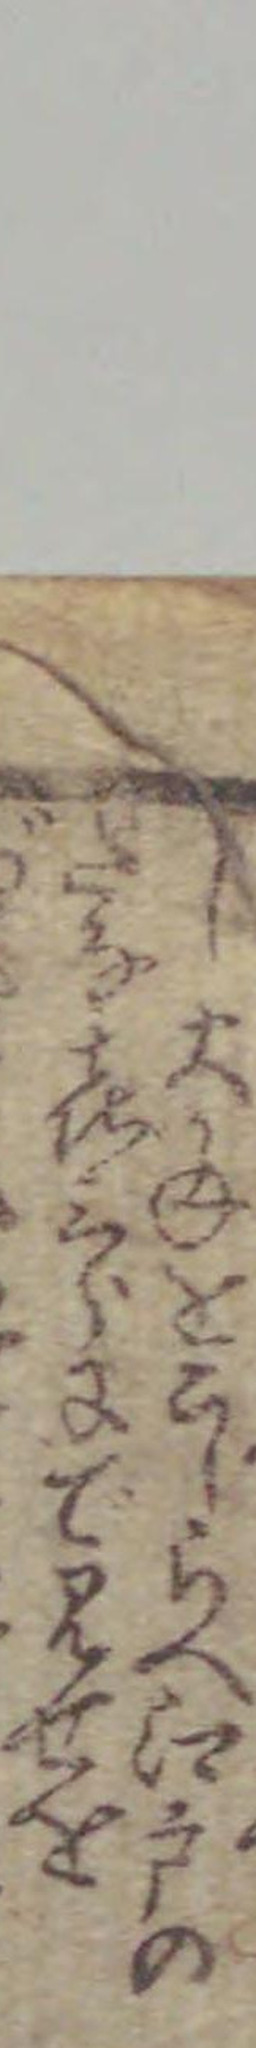たな喜三郎にて見せを
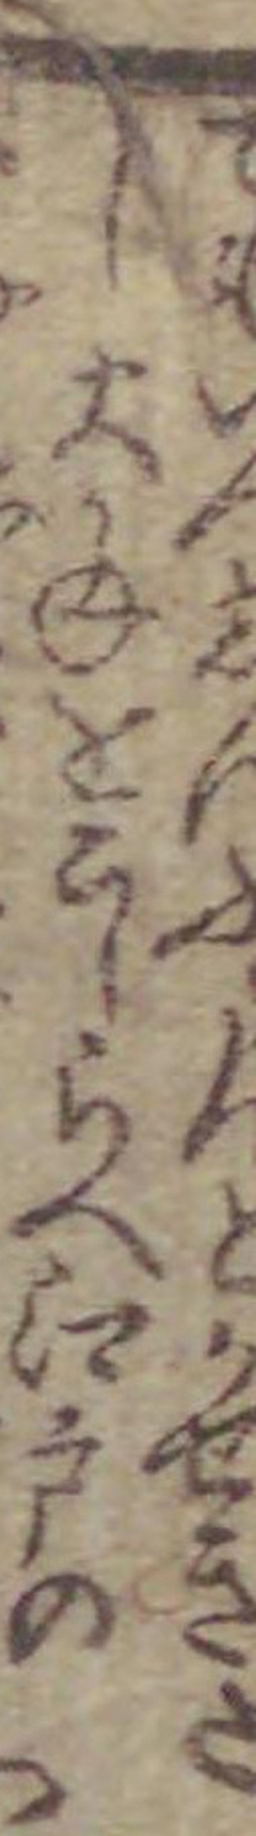し大かねをこしらへ江戸の
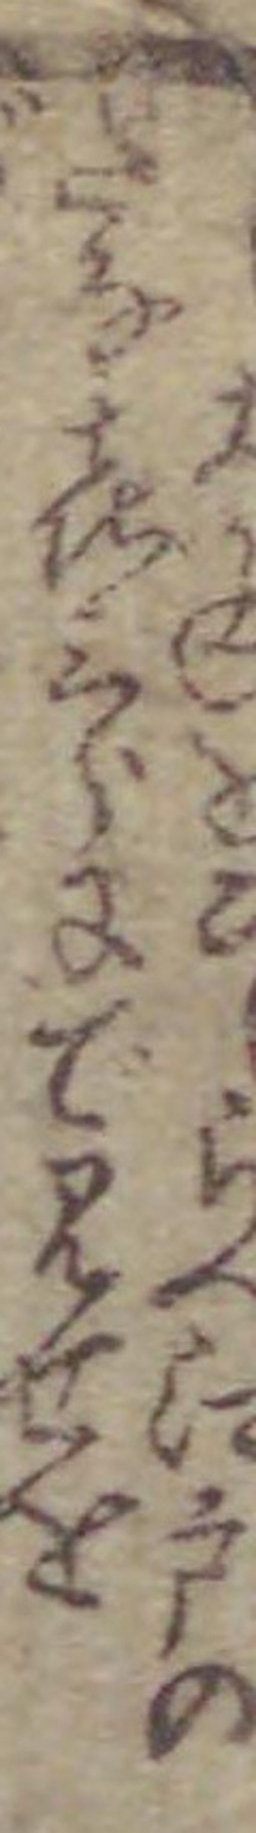たな喜三郎にて見せを
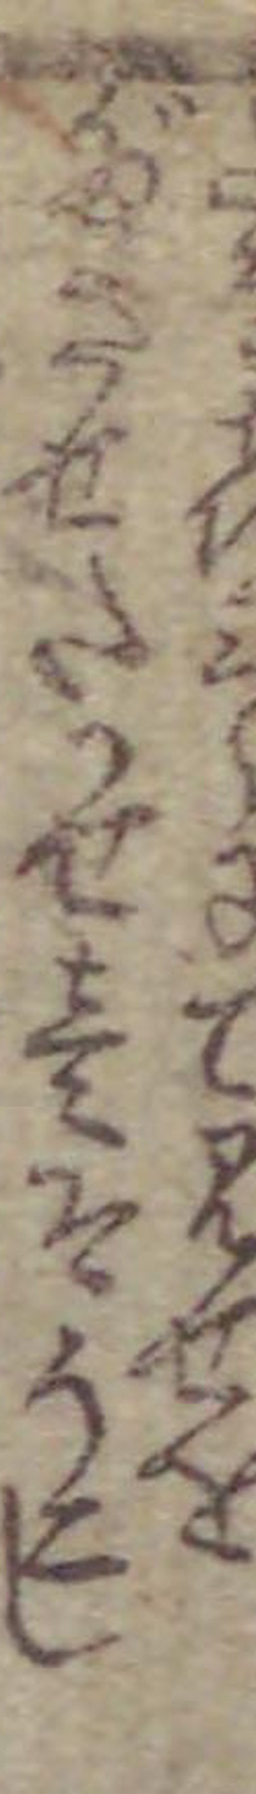ださせたかせ壱そうこし
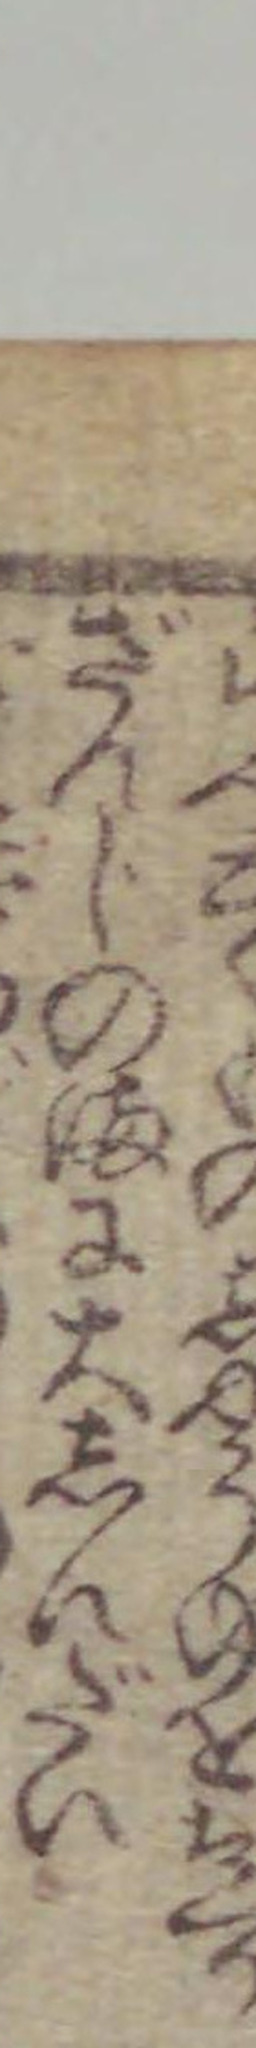ざんじのまに大しんだい
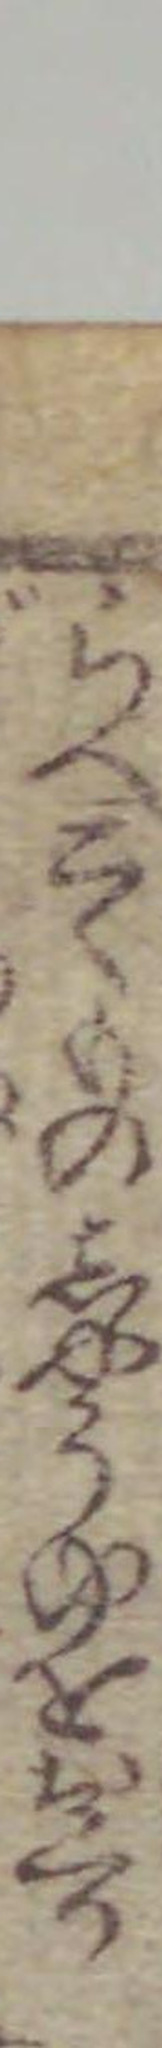らへこくものしやうゆをおくり
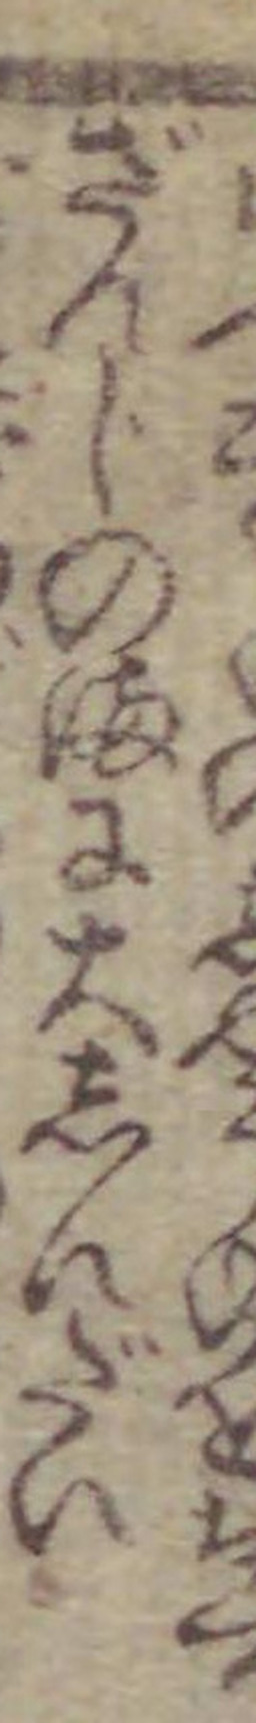ざんじのまに大しんだい
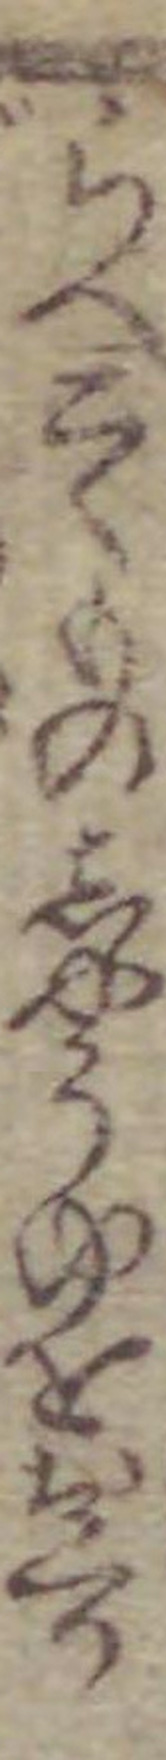らへこくものしやうゆをおくり
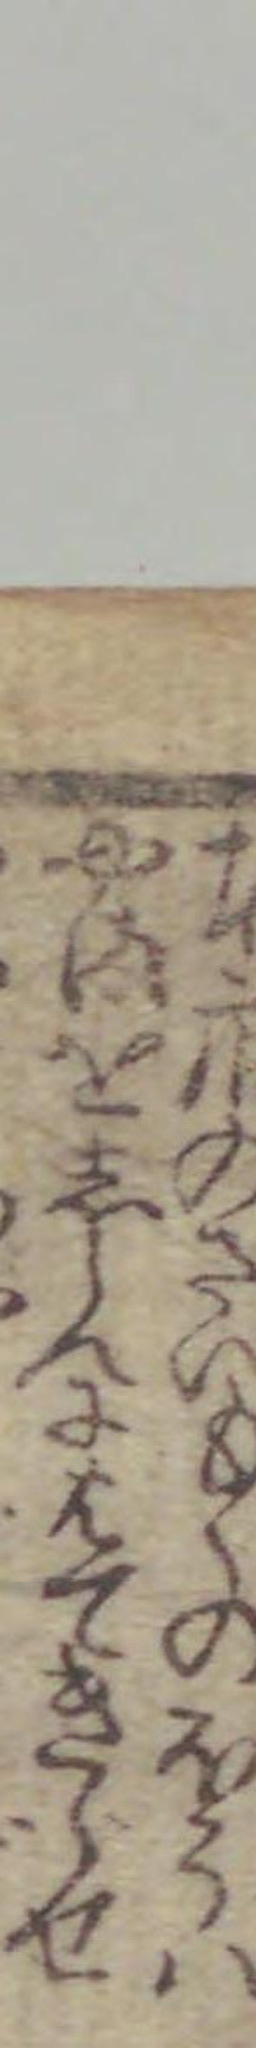やまをじしんにはてきらせ
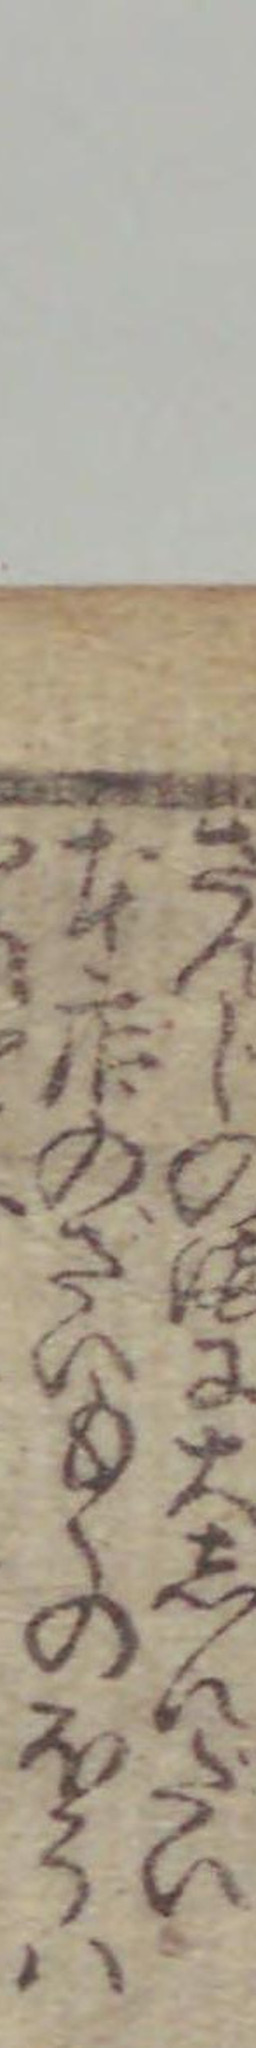本店のざいもくのほうは
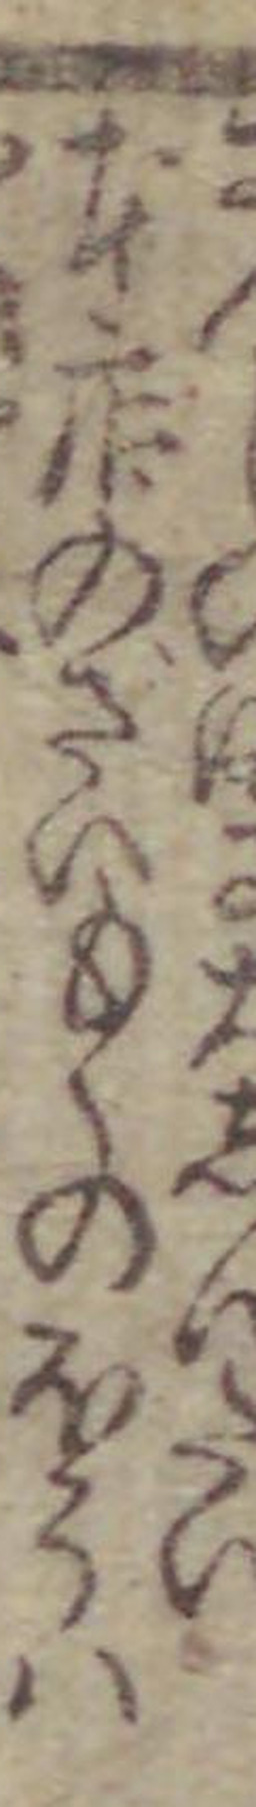本店のざいもくのほうは
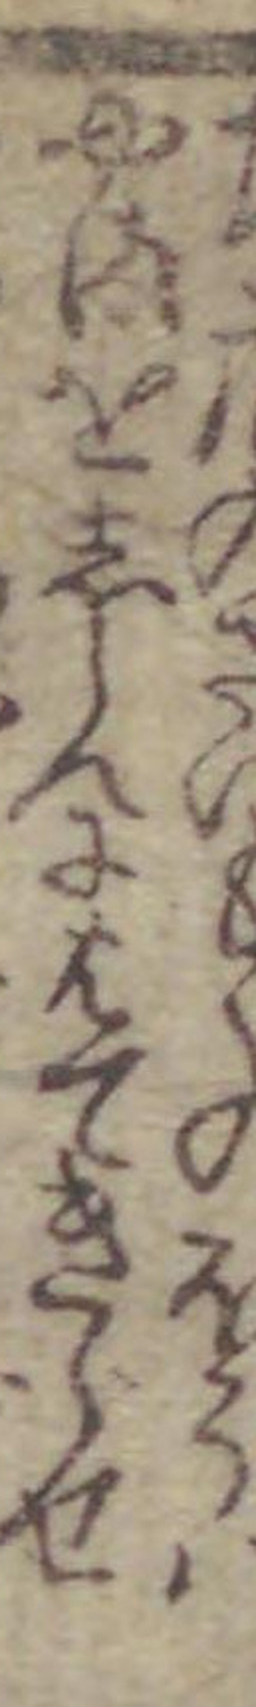やまをじしんにはてきらせ
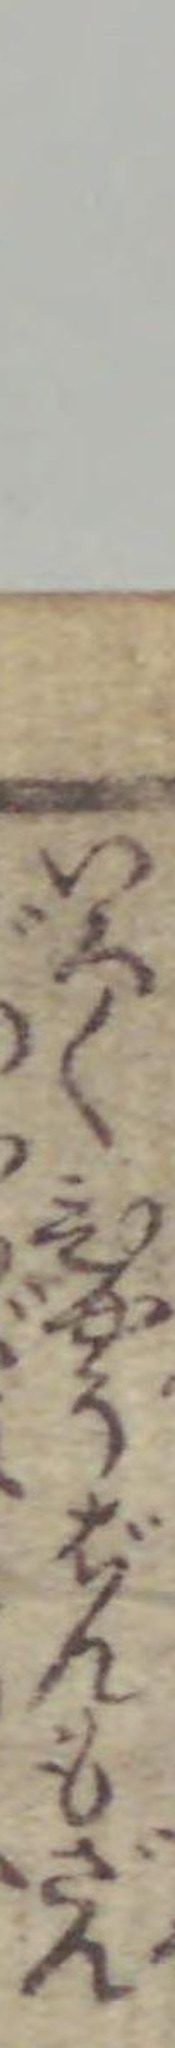いろ〳〵ひやうばんもざん
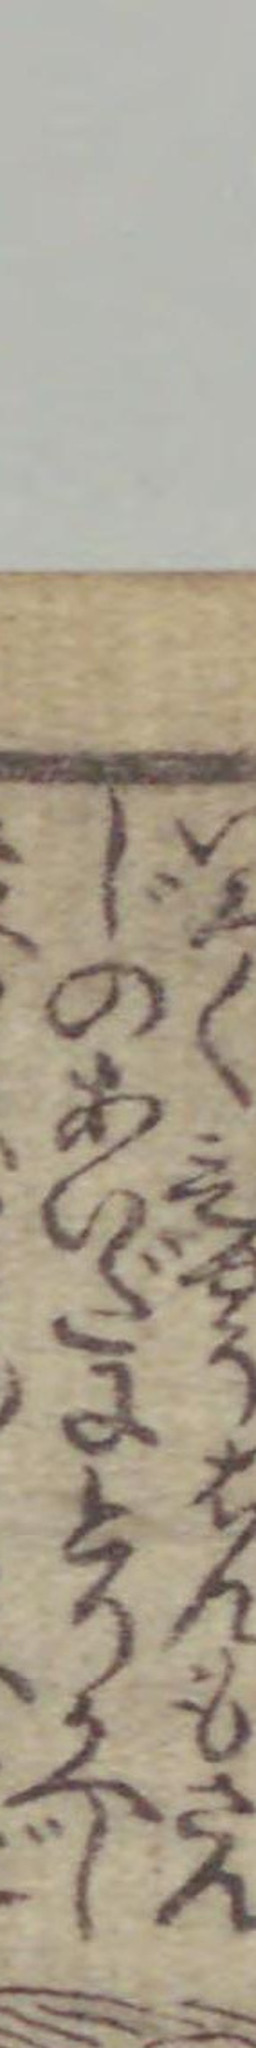じのあいだにとりかへし
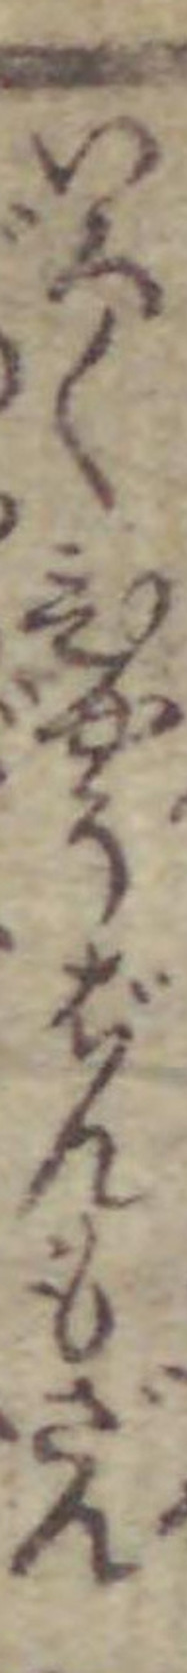いろ〳〵ひやうばんもざん
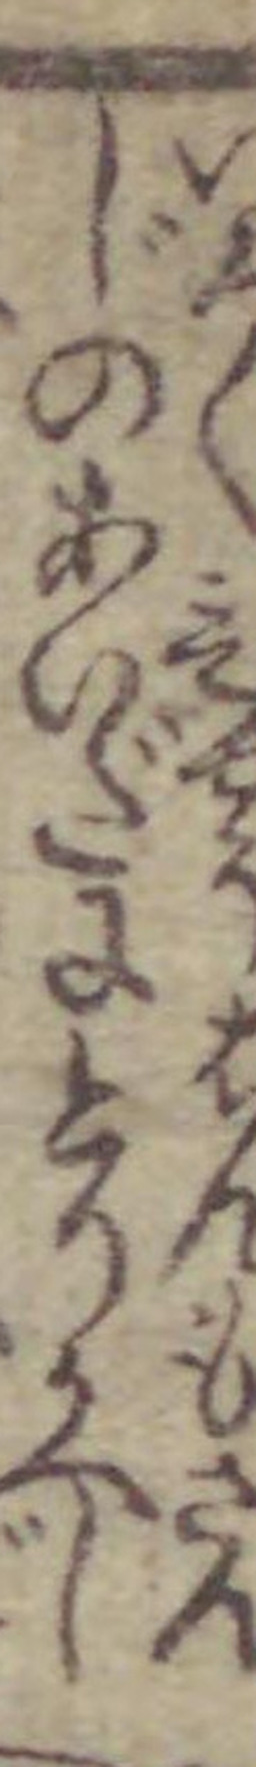じのあいだにとりかへし
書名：親父布子鳶握 3巻
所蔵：国立国会図書館 National Diet Library, JAPAN
